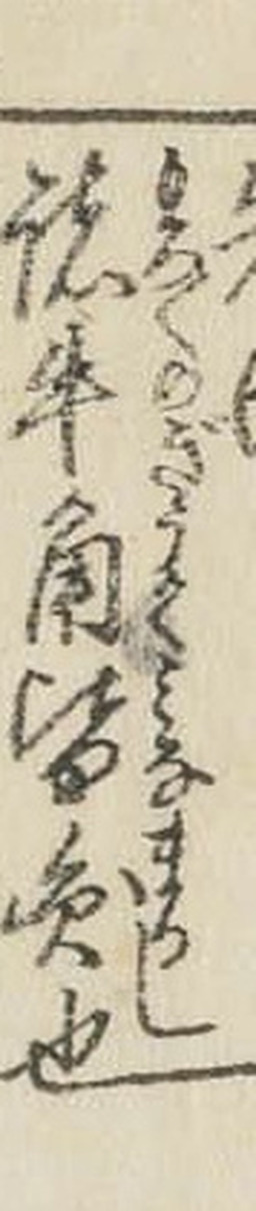諸牛角皆円也
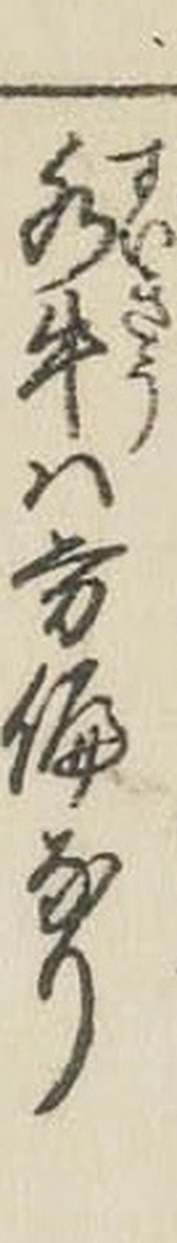水牛は方偏なり

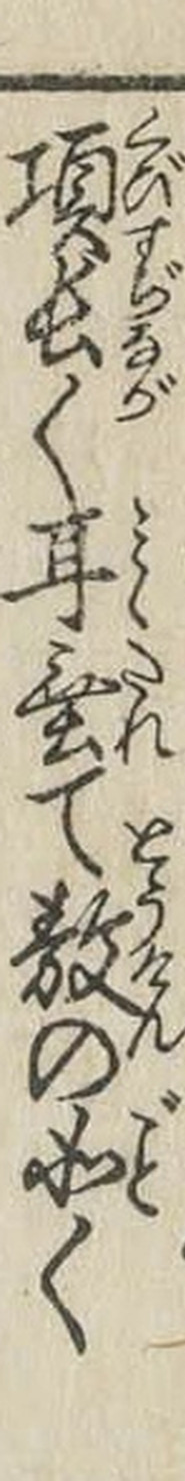項長く耳垂て獒の如く
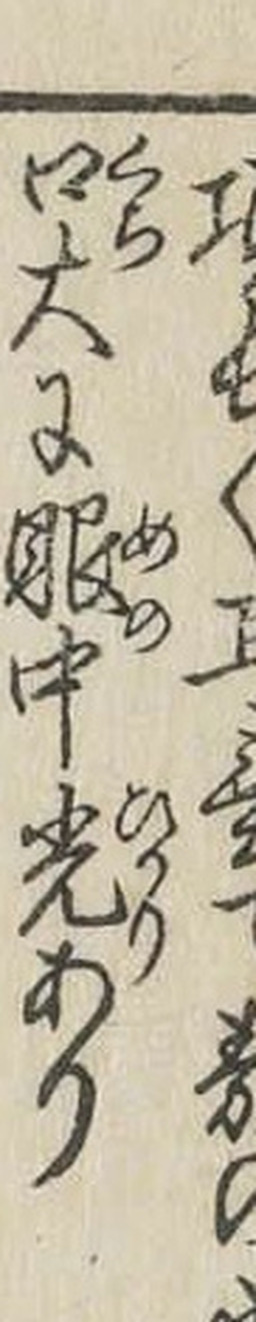口大に眼中光あり
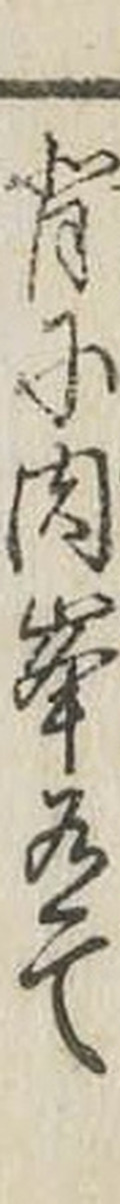背に肉峯有て
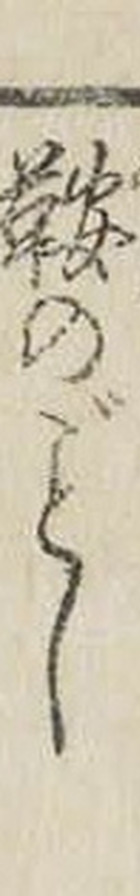鞍のごとし
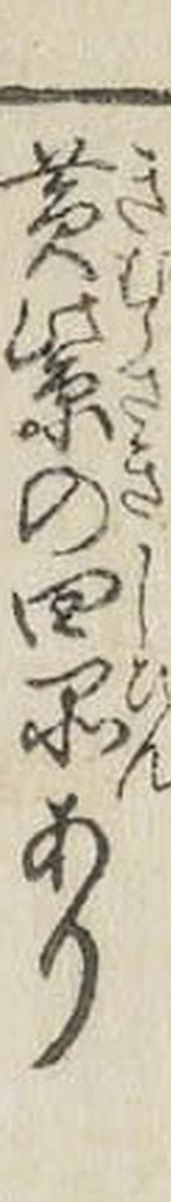黄紫の四品あり
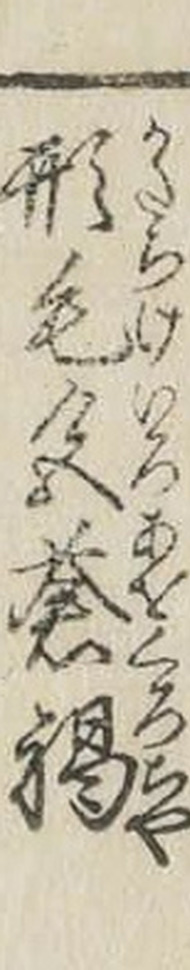形毛色蒼褐
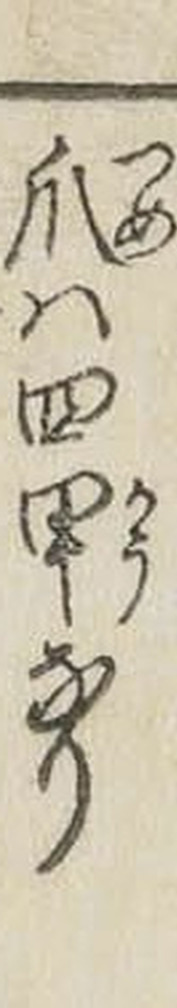爪は四甲なり
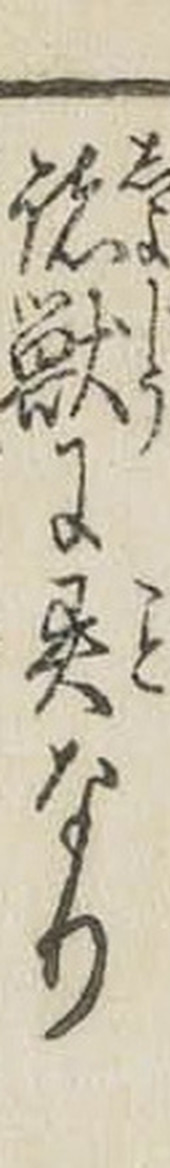諸獣に異なり
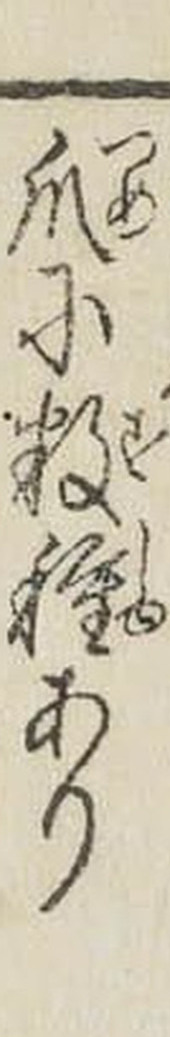爪に数種あり
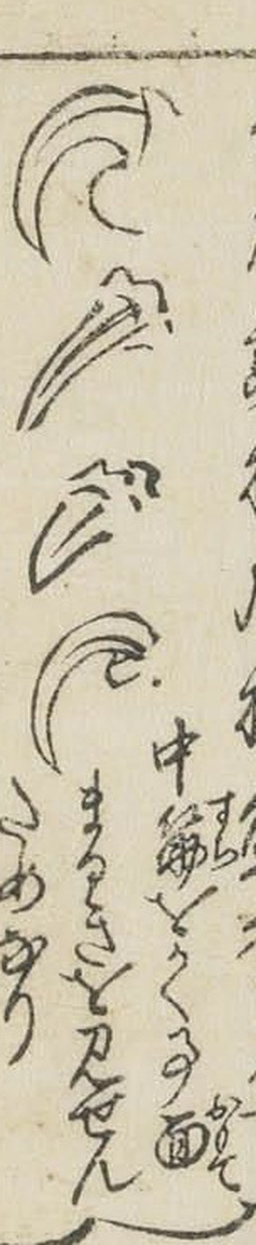まるきを見せん
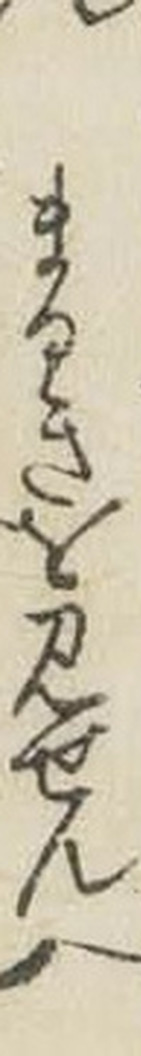まるきを見せん
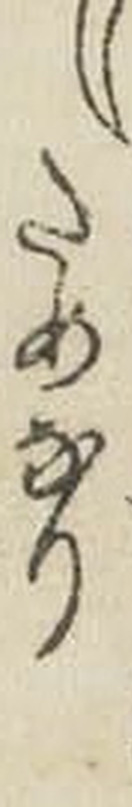ためなり
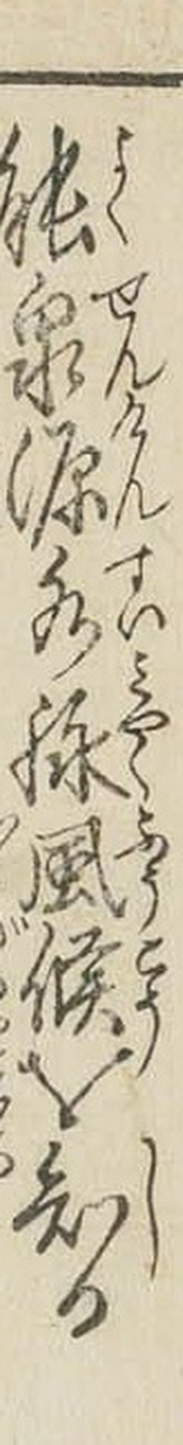能泉源水脈風候を知る
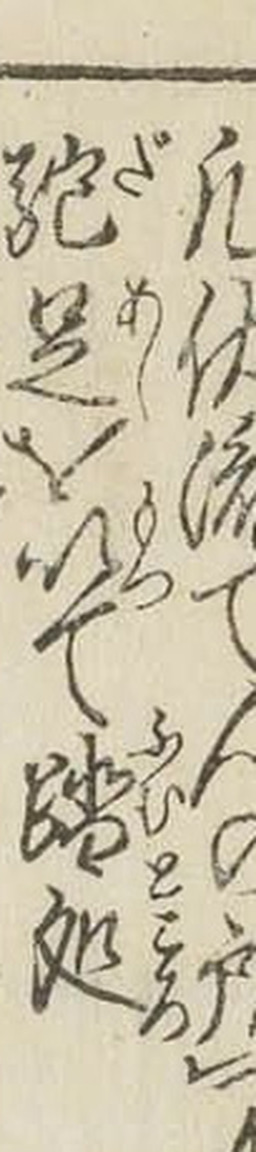駝足を以て踏処
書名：絵本写宝袋 9巻 9之巻下
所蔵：東京学芸大学教育コンテンツアーカイブ
